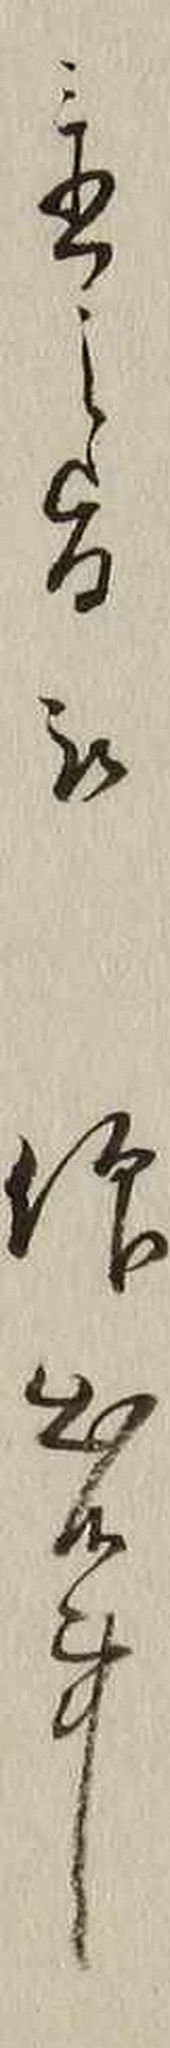置之旨被仰出候事
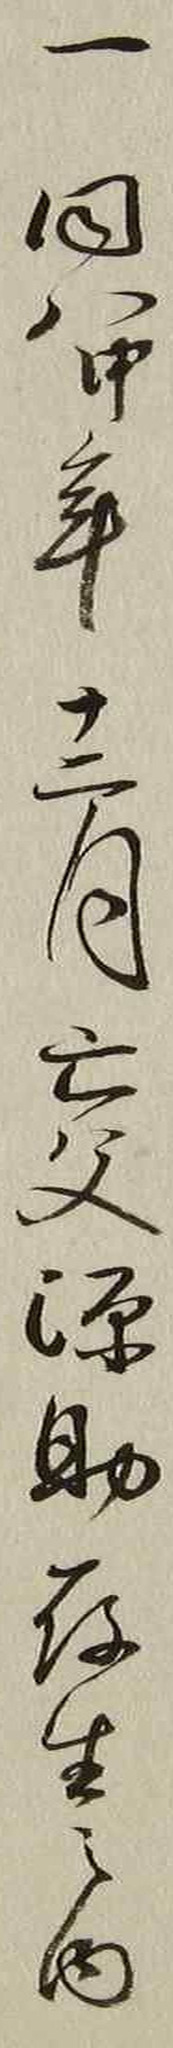一同八申年十二月亡父源助存生之内
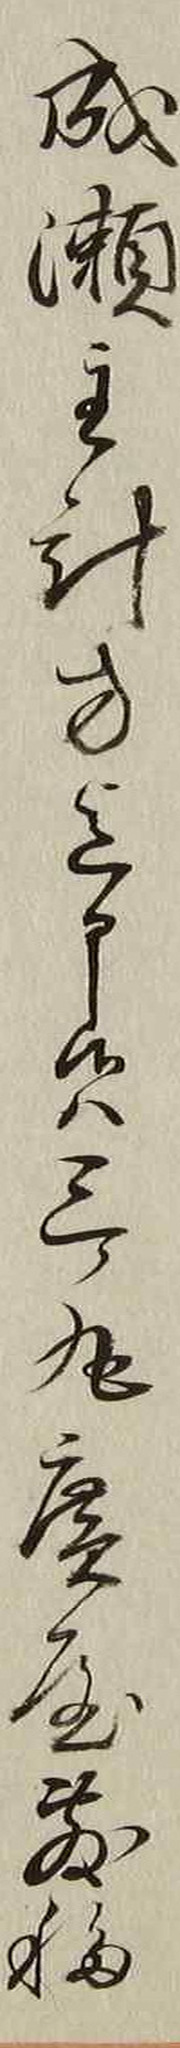成瀬主計方迄申候は三ノ丸広屋敷移
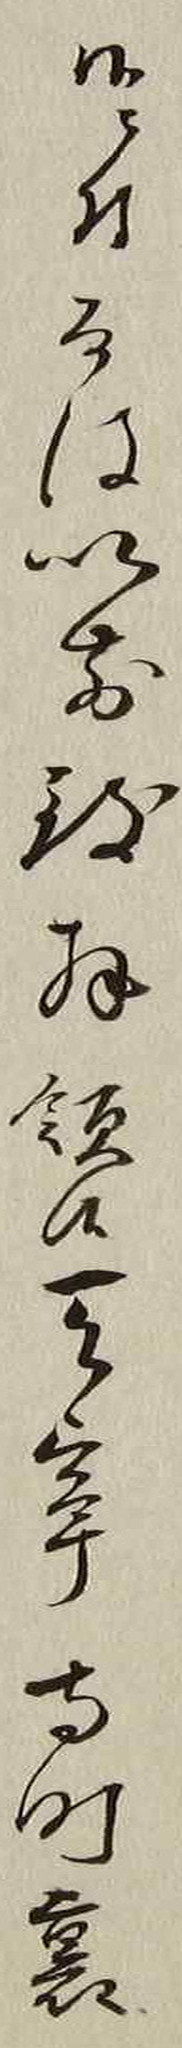候に付は以前致拝領候天寧寺町裏
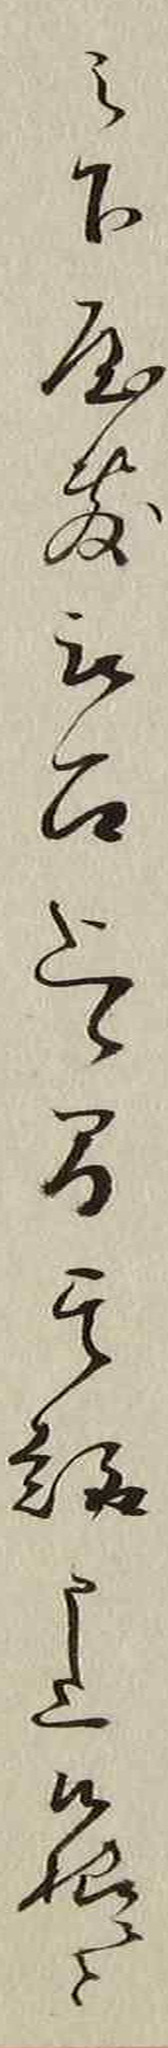之下屋敷被召上候間其趣申上候様にと
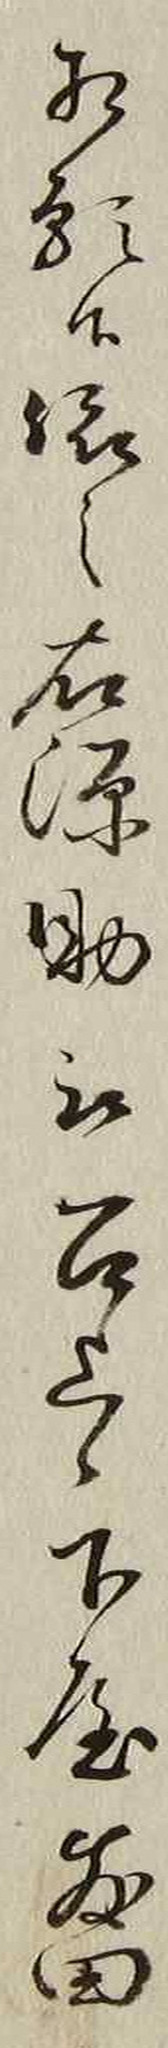相願候依右源助被召上候下屋敷田
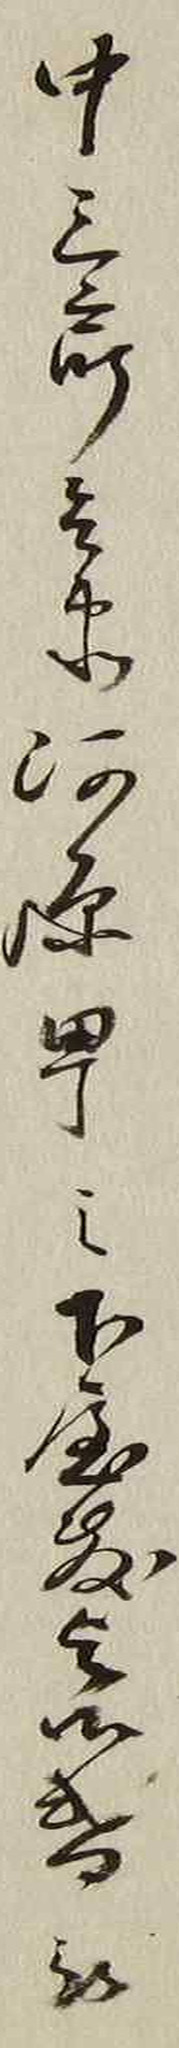中三郎兵衛河原町之下屋敷と御替被
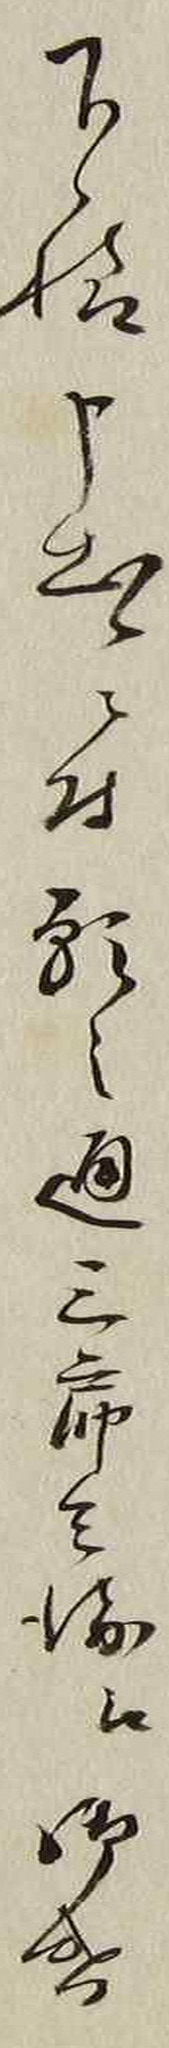下候様申出候に付願之通三郎兵衛江御替
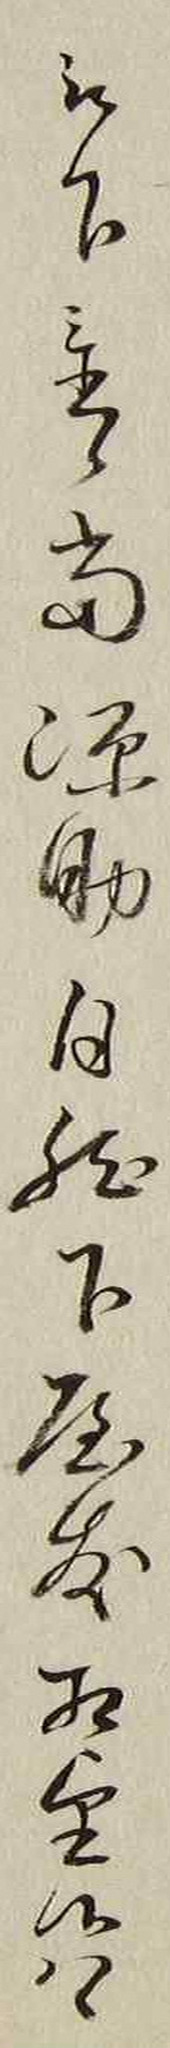被下置之当源助自然下屋敷相望候はゝ
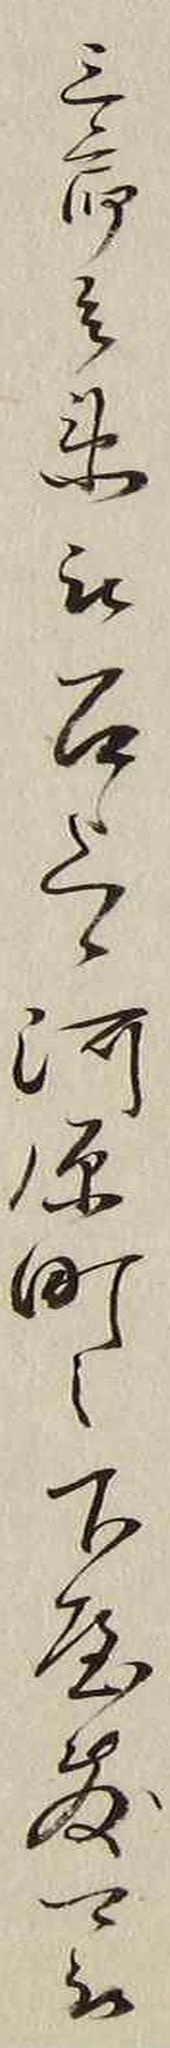三節兵衛被召上候河原町之下屋敷可被
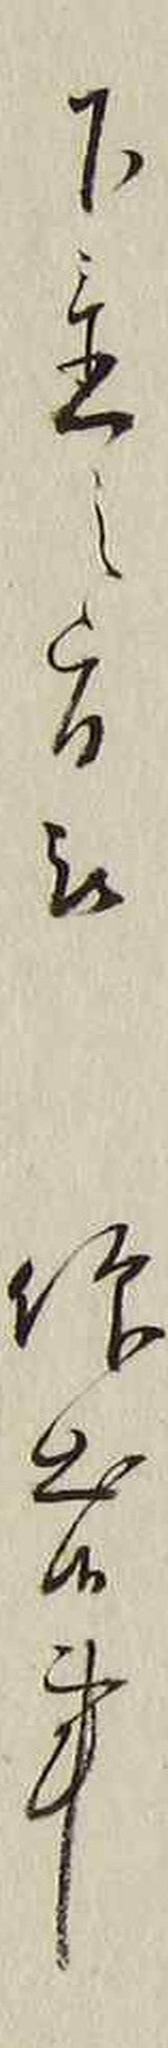下置之旨被仰出候事
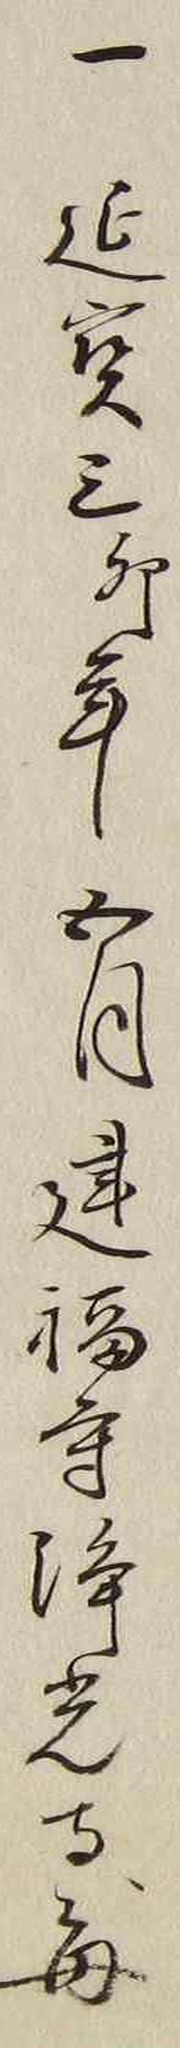一延宝三卯年五月建福寺浄光寺へ毎

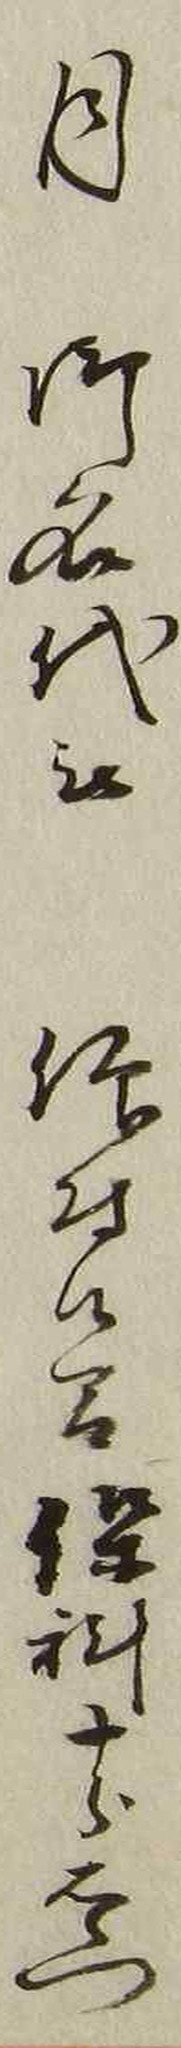月御名代被仰付候間保科十郎右衛門
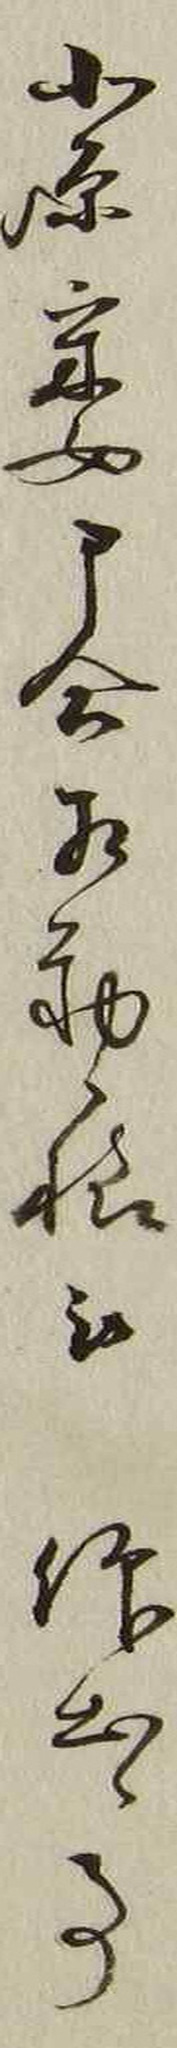北原采女申合相勤候様被仰出候事
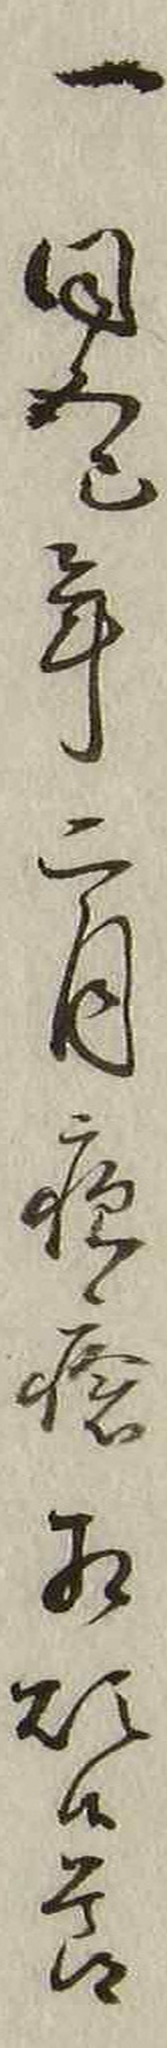一同五巳年二月疱瘡相煩候節
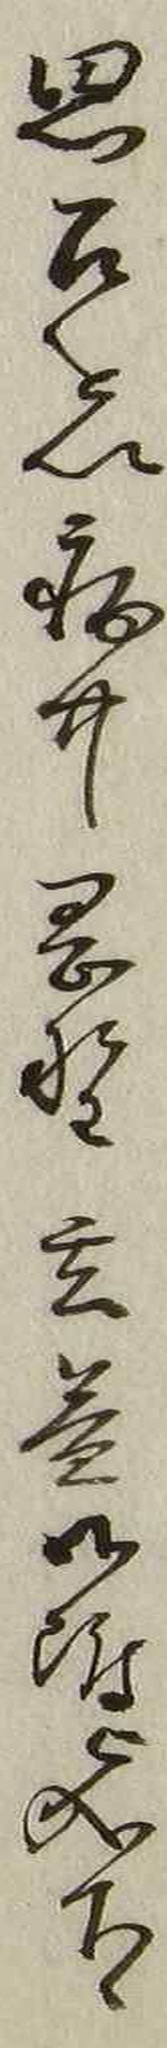思召を以病中岡野玄益御附被成下候
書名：諸士系譜　巻之159　な之部1
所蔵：会津若松市立会津図書館
